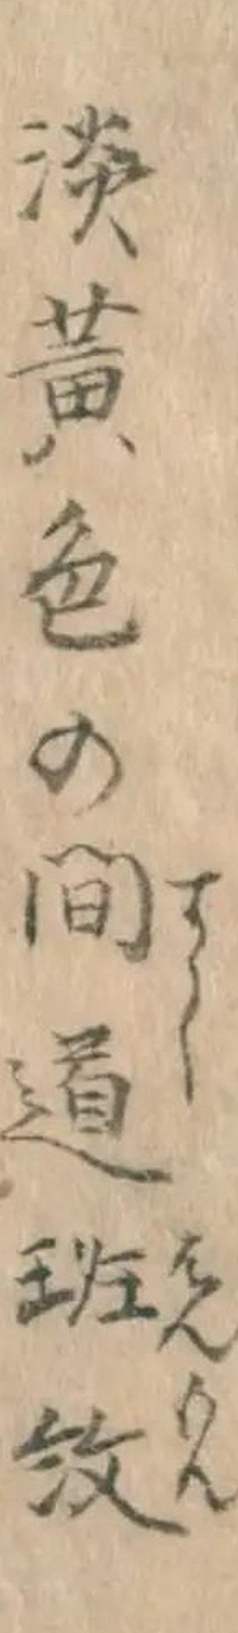淡黄色の間道斑紋
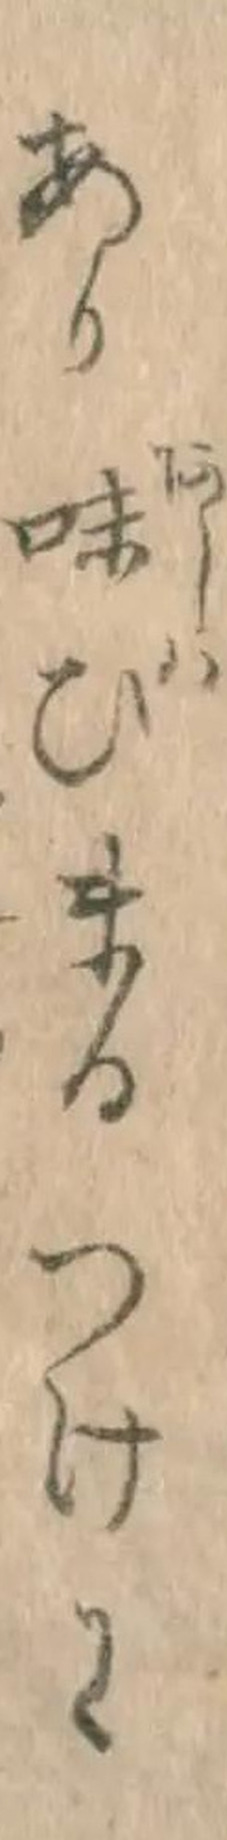あり味ひまるつけに
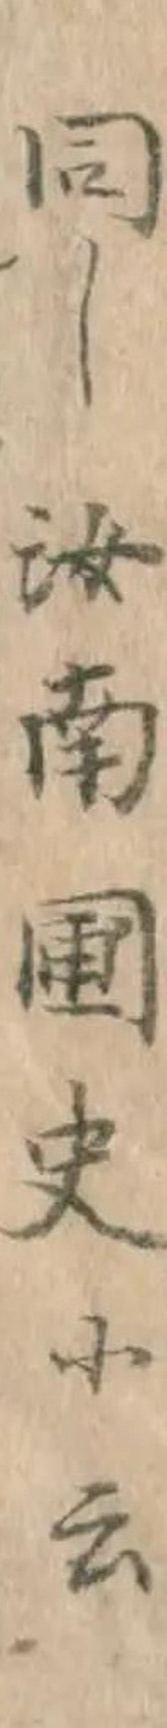同し汝南圃史に云
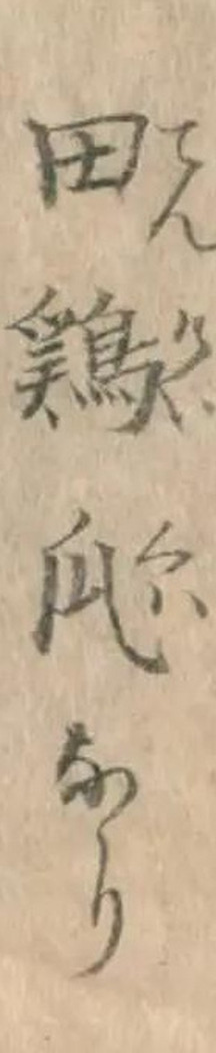田鶏瓜なり
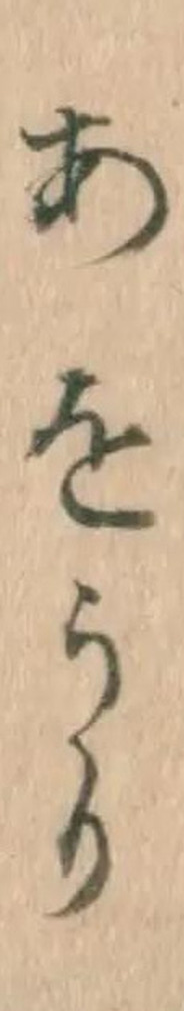あをうり

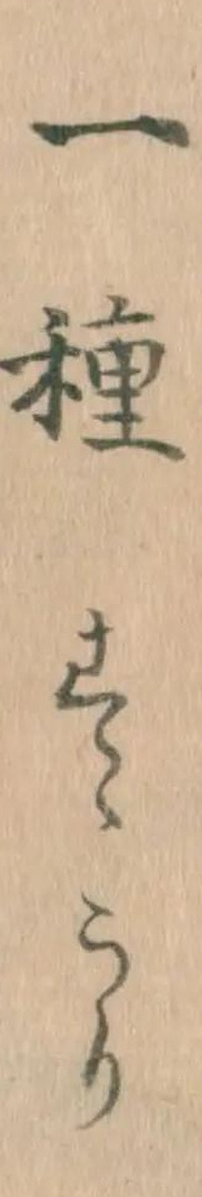一種すゝうり
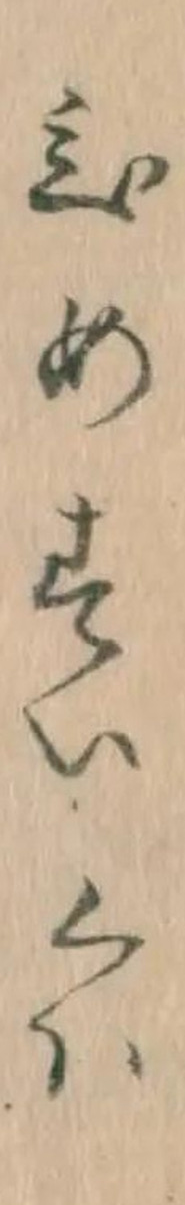ひめすいくは
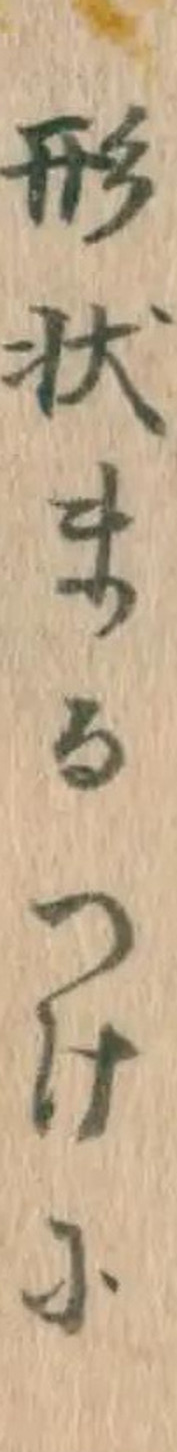形状まるつけに
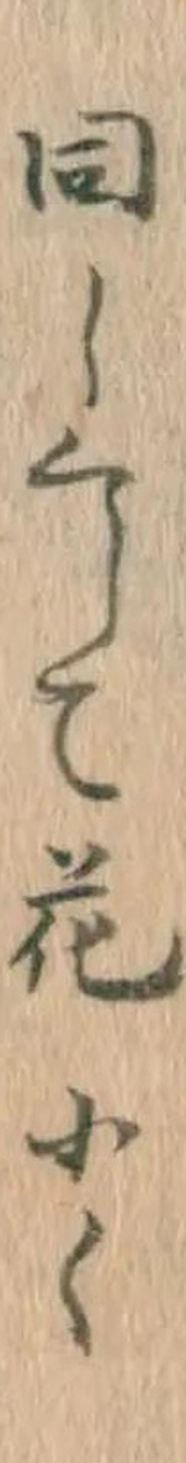同しくして花小く
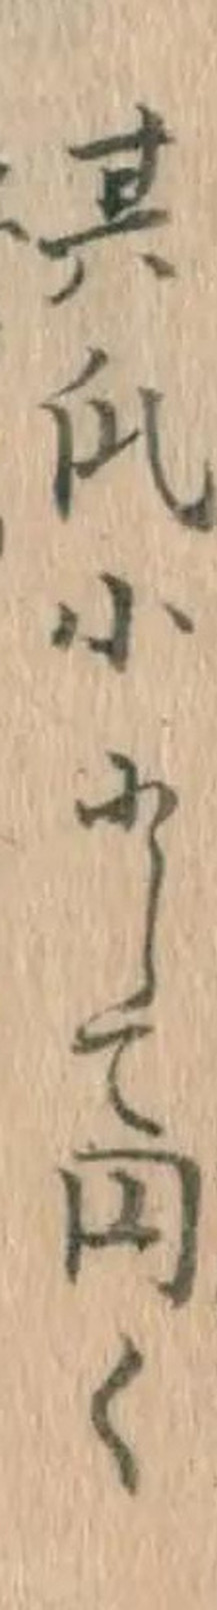其瓜小にして円く
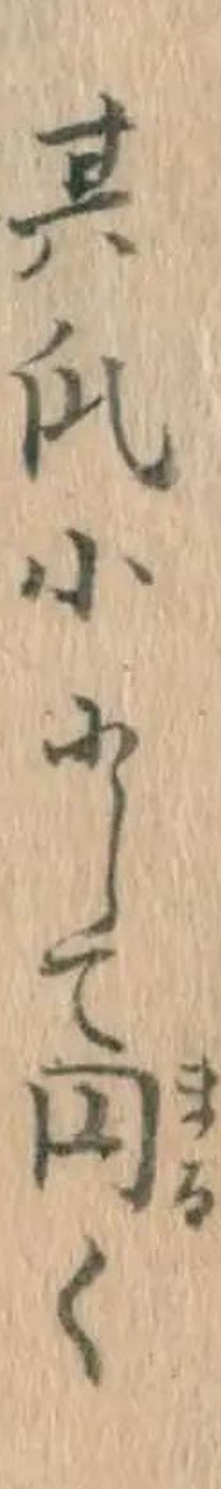其瓜小にして円く
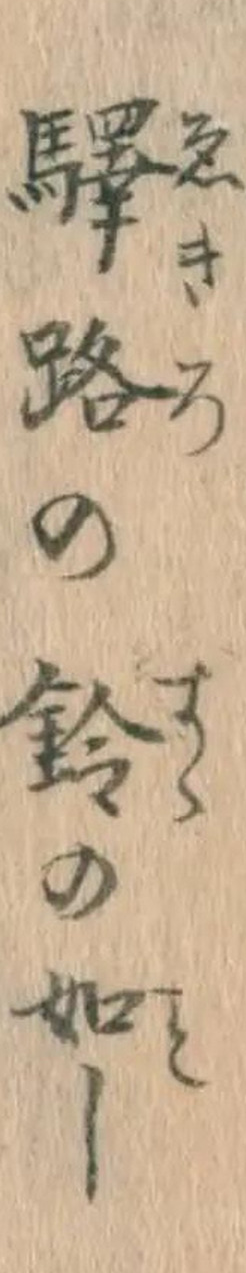駅路の鈴の如し
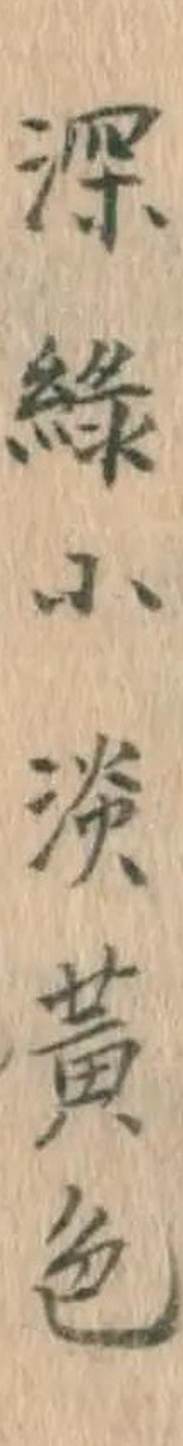深緑に淡黄色
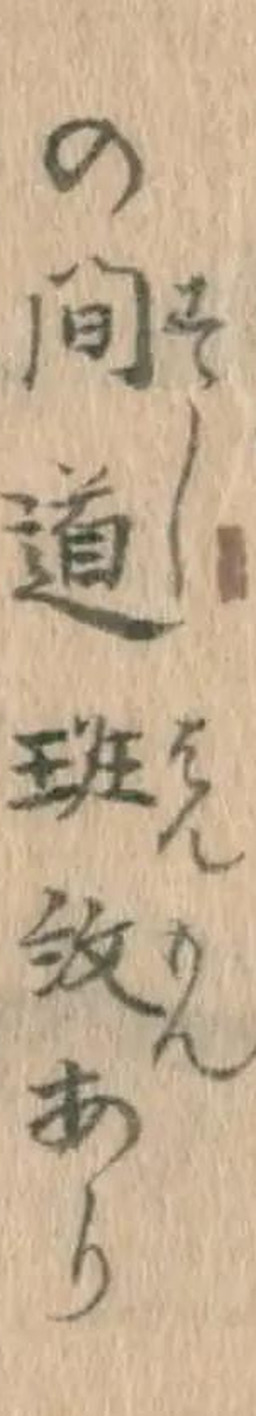の間道斑紋あり
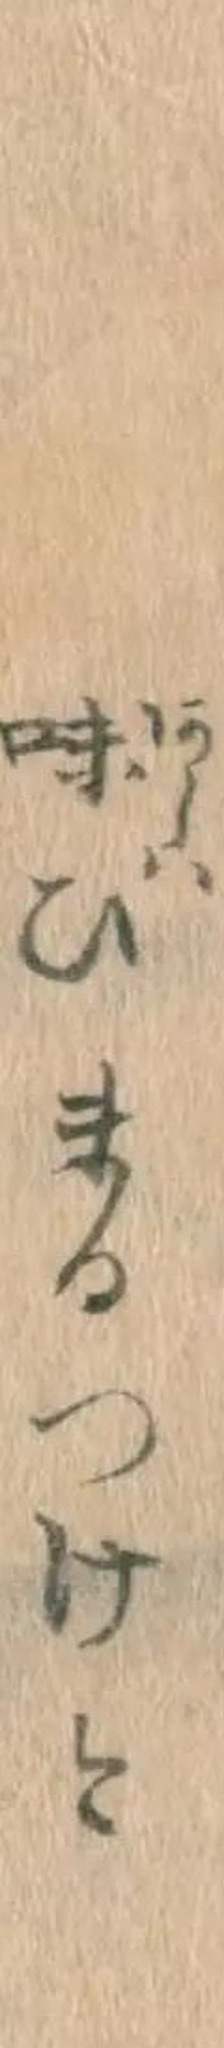味ひまるつけと
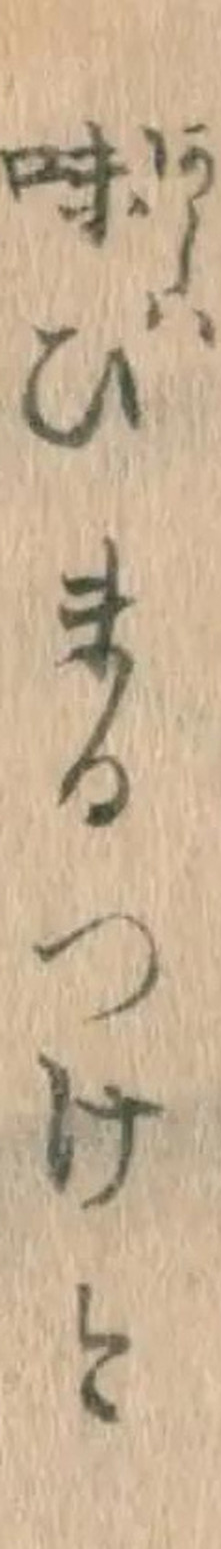味ひまるつけと
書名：本草図譜. 巻52-54
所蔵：国立国会図書館 National Diet Library, JAPAN
